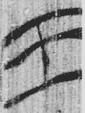王
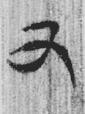又（有）
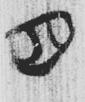四
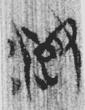海
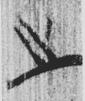之
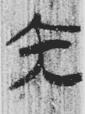内
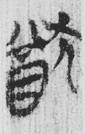○（猶）
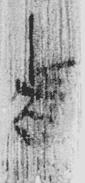○（賚）
